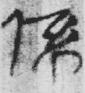係
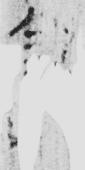○（遯）
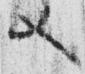又（有）
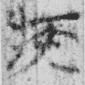疾
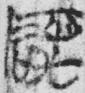○（厲）
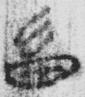畜
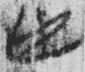臣
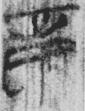妾
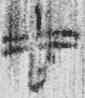吉
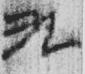九
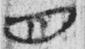四
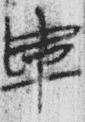好
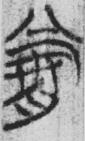○（遯）
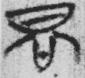君
